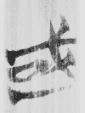或
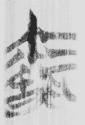{尒䎽}
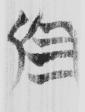於
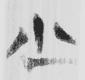少
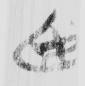臣
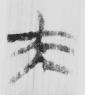夫
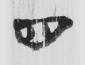四
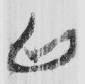㠯（以）
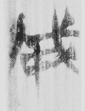成
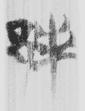邦
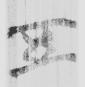五
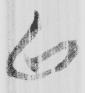㠯（以）
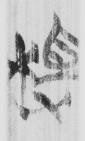{相又}
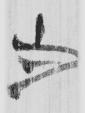之
